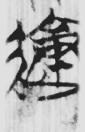{辶𫢁}
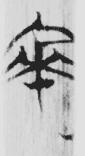{宀𠂔}
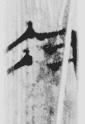今
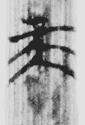天
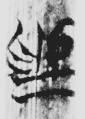爲
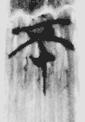不
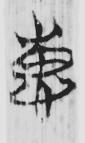惠
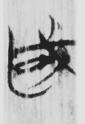或
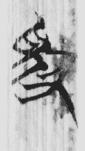爰
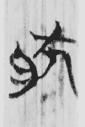{肉犬}
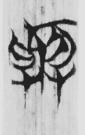與
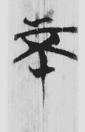不
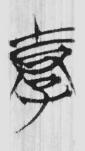{𫯁子}
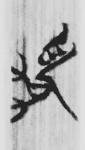爭
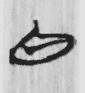白
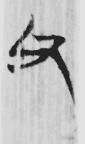父
